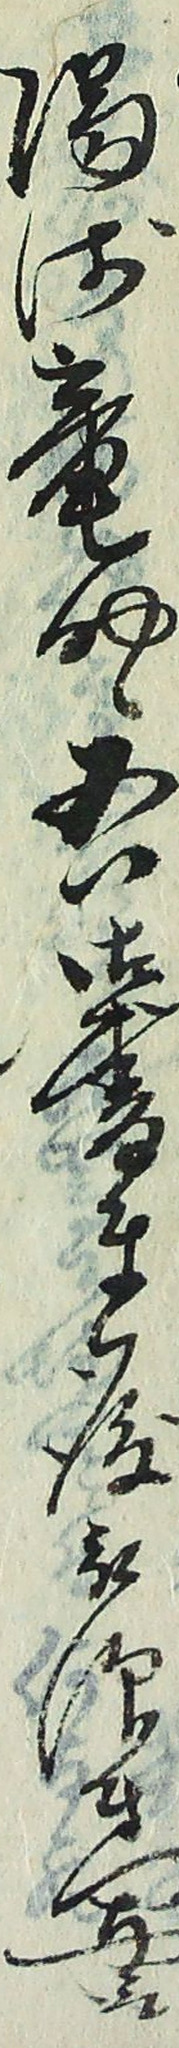湯浅竜助へ右御書付御渡被仰付写取
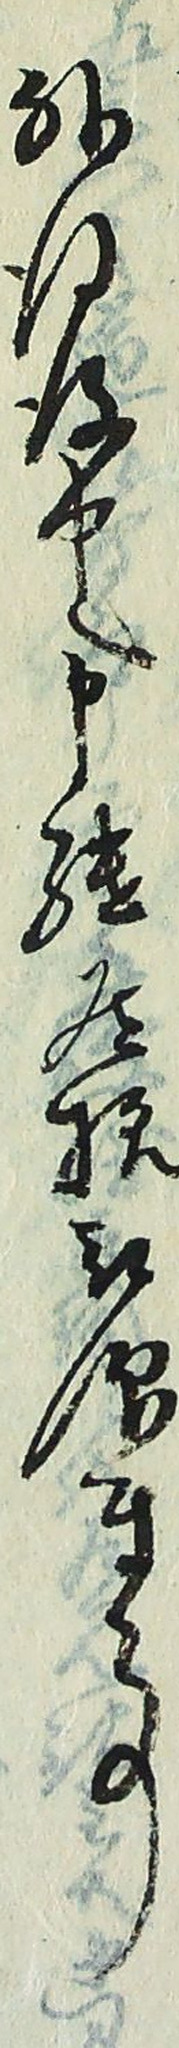外同役中へ申継候様被仰付候事
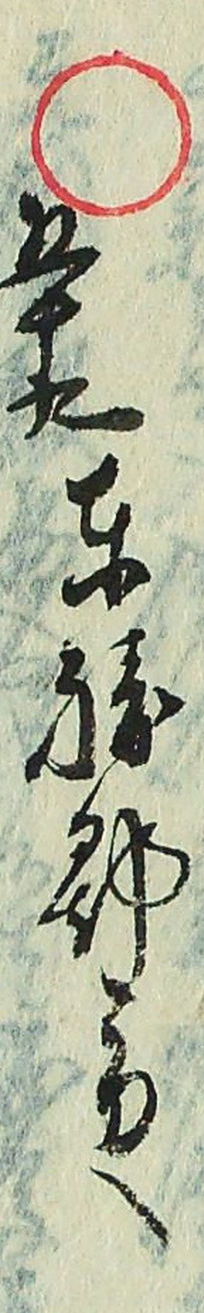○五十九東勝郡方へ
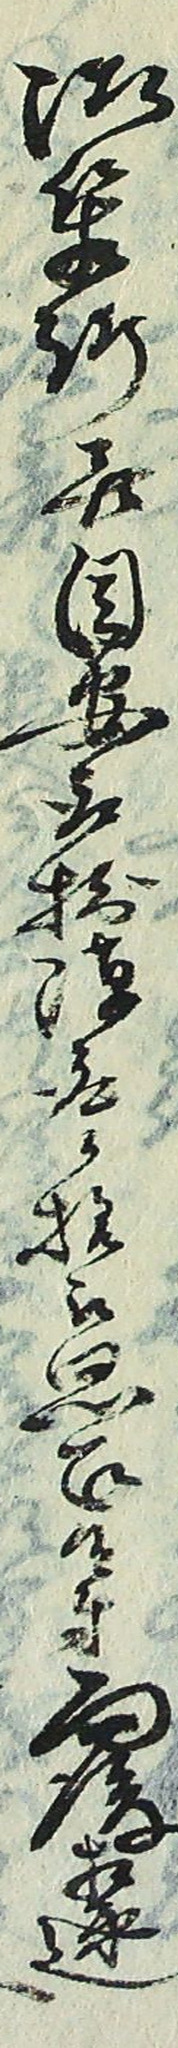御箱訴幷目安取捌隙取候様被思召候ニ付向後相速
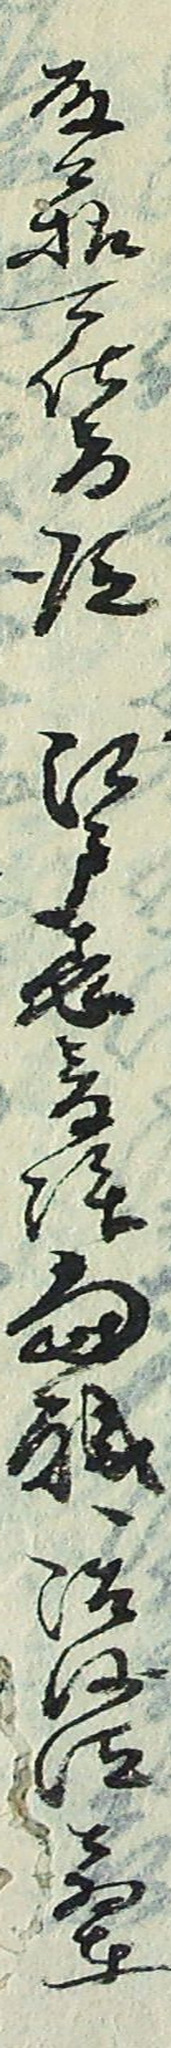取候様可仕旨従江戸表爰許當職へ御沙汰被為在
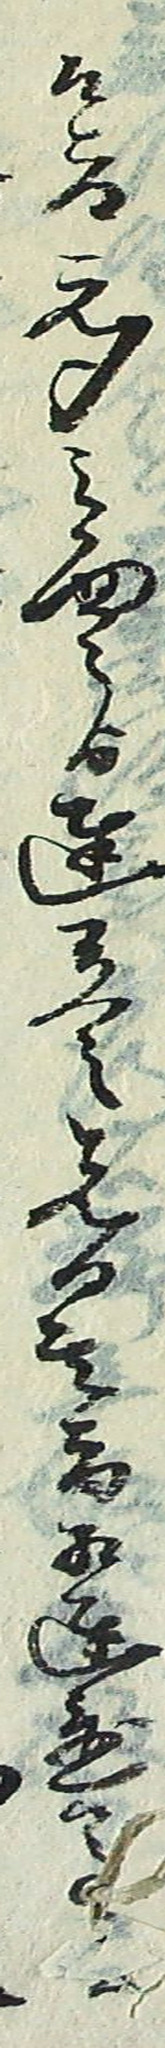候旨元〆之面々ゟ達有之先日其旨相達置候事ニ候
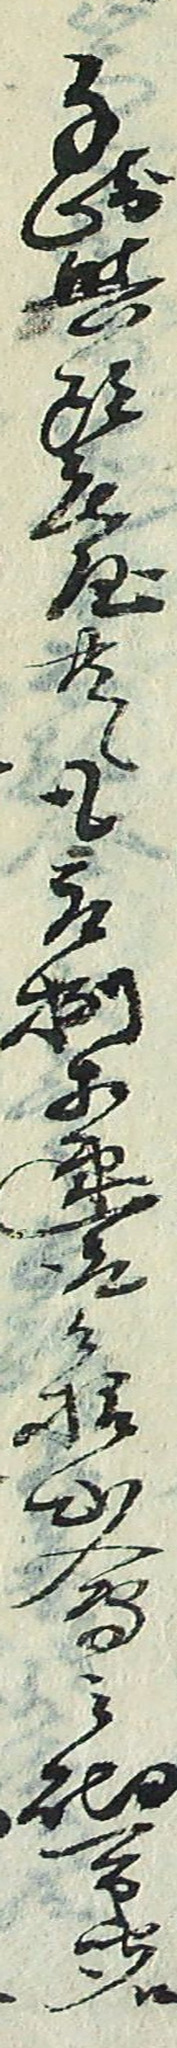手崎與頭庄屋共へも取捌相速取候様出會之砌可申聞候
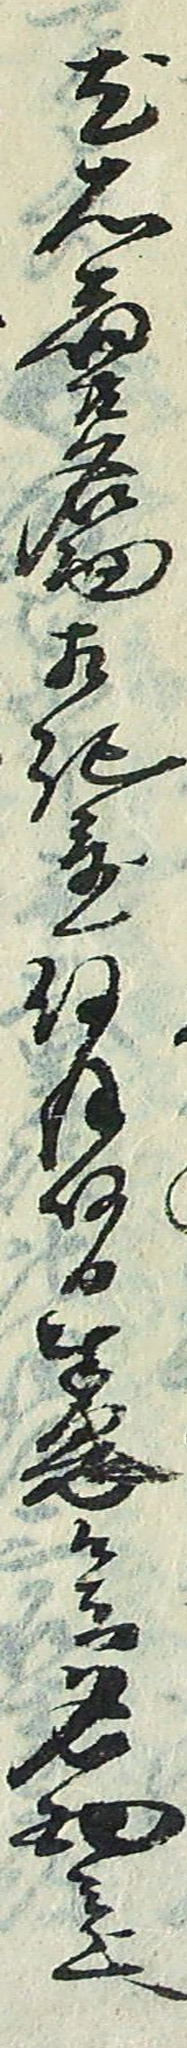尤右者共名面相記置何月何日奉畏候旨名面之上へ

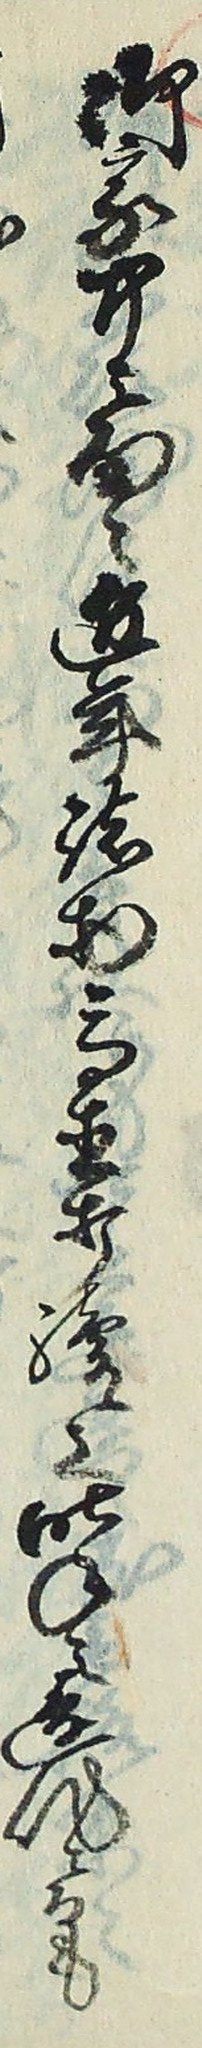御家中之面々近年諸物高直打續候上昨年之違作ニ而も
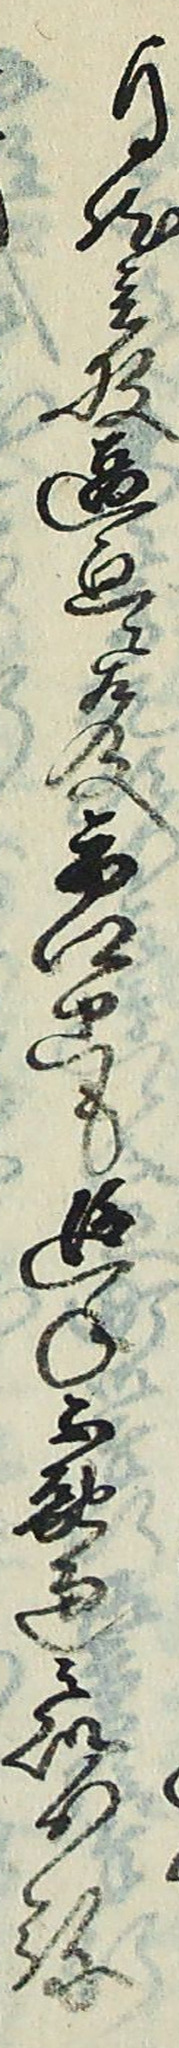自然壱牧逼迫ニ相及市郷迚も追年不融通之処ゟ弥
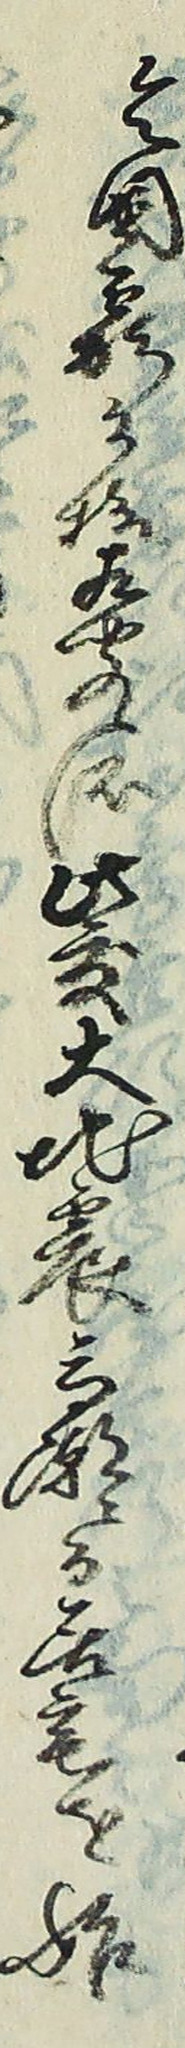令困窮候様相聞候所此度大地震高潮ニ而居宅を始
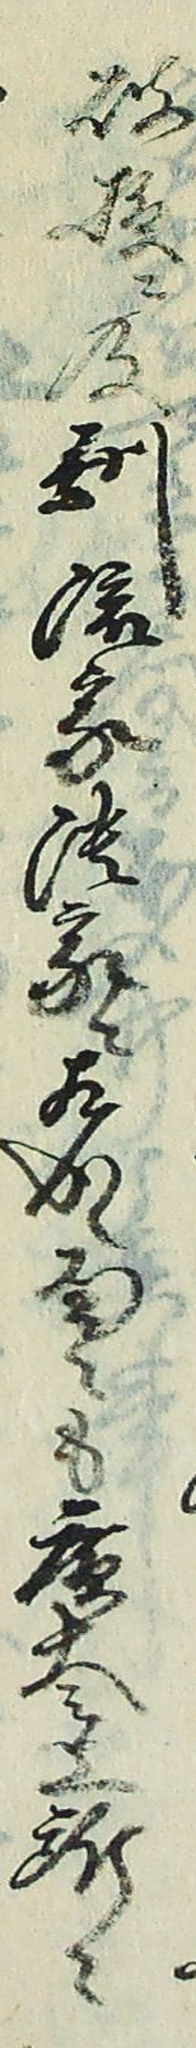破損ニ及剩流家潰家ニ相成候面々も廣大之上所々
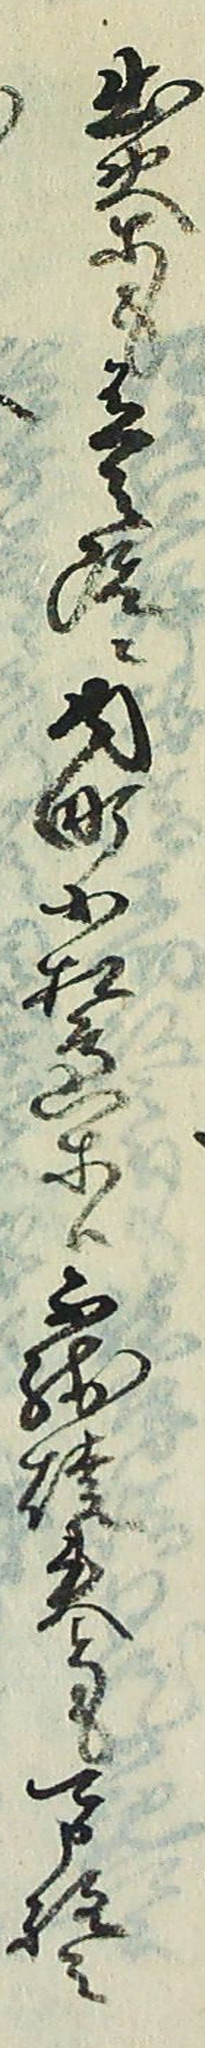出火等も有之既ニ内町小松嶋等ハ不残焼失とも可申程之
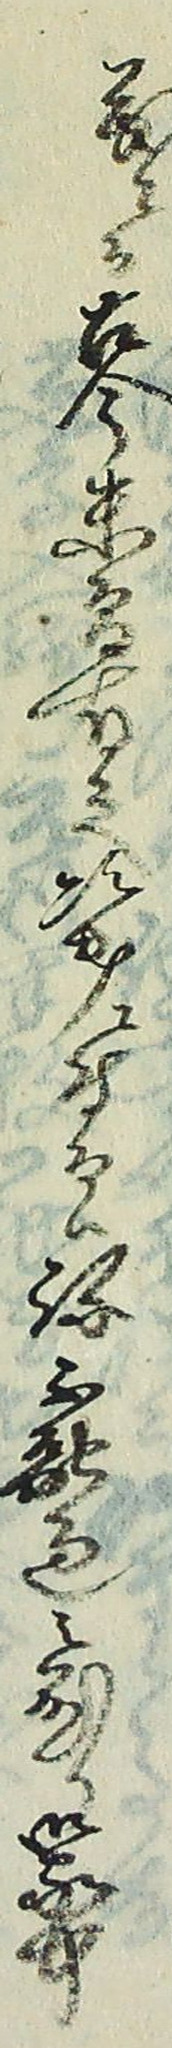義ニ而古今未曾有之次第ニ付而ハ弥不融通之懸り御家中
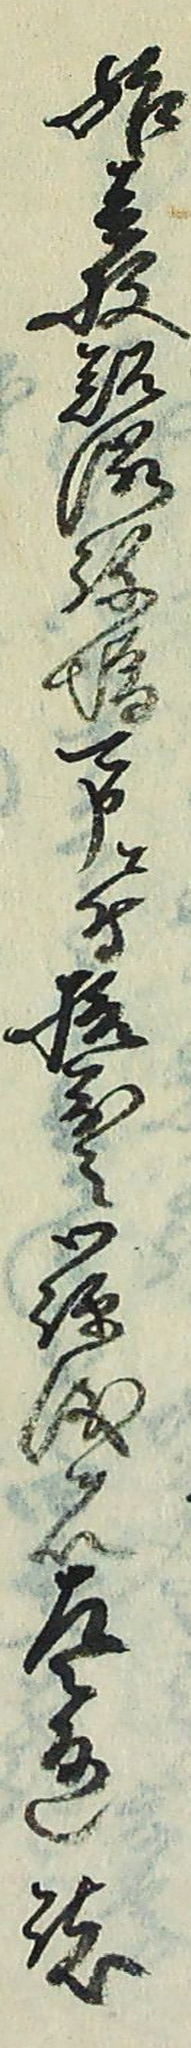始壱牧難渋弥増可申ニ付格別之御評儀ヲ以左之通諸
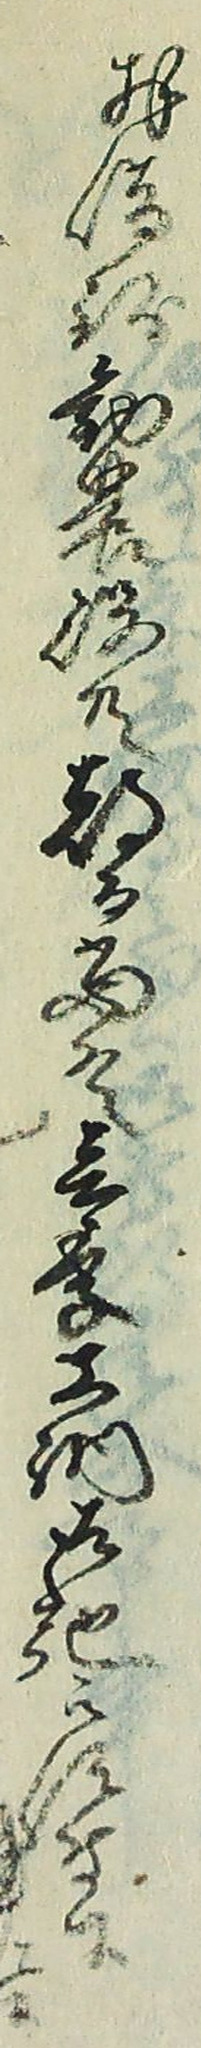拝借銀勧農趣共都而當冬壱季上納御馳被仰付候事ニ候
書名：諸御趣意書并御下知向之写
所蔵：鳴門教育大学 Naruto University of Education
